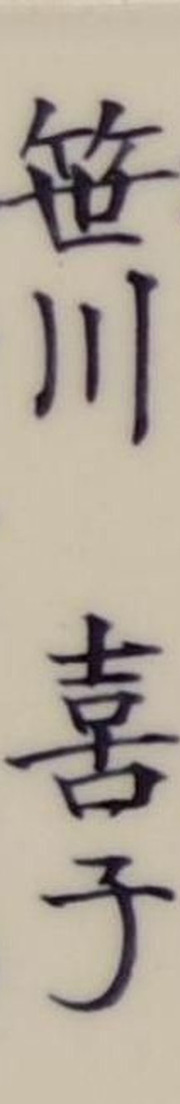笹川喜子
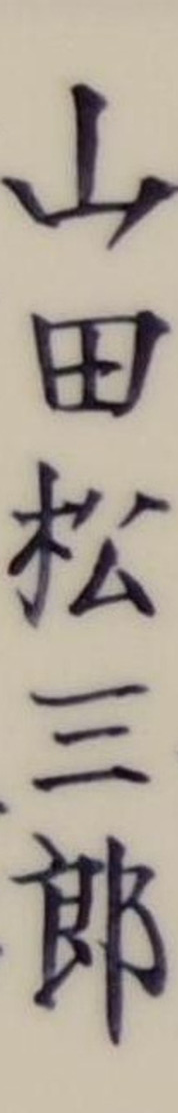山田松三郎
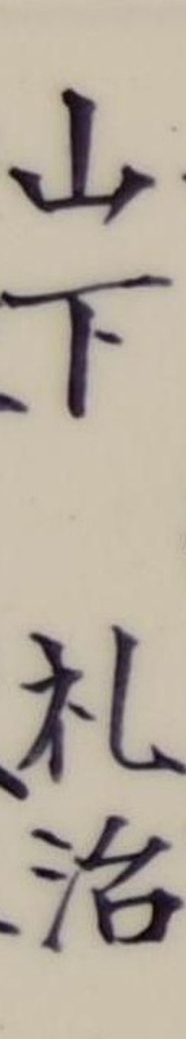山下札治
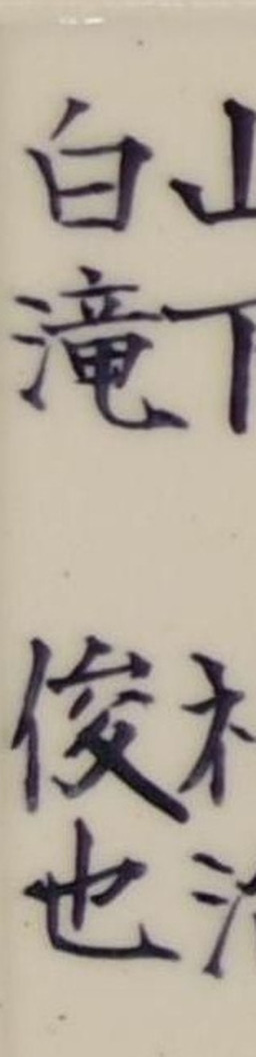白滝俊也

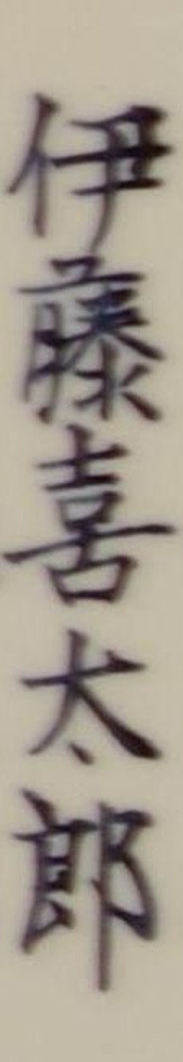伊藤喜太郎
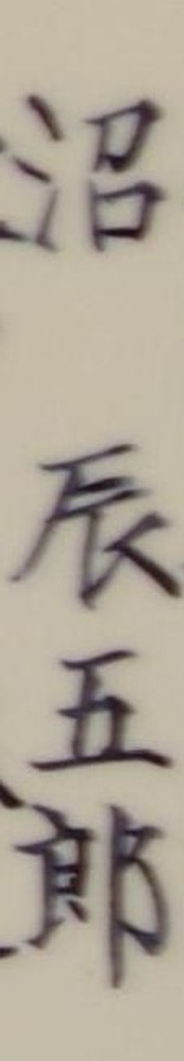沼辰五郎
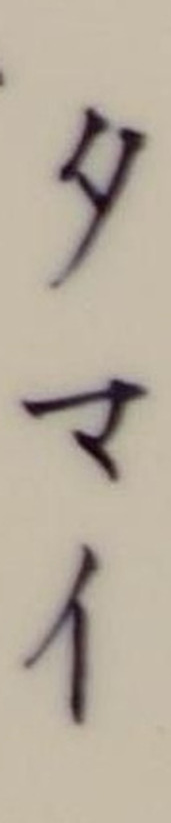タマイ
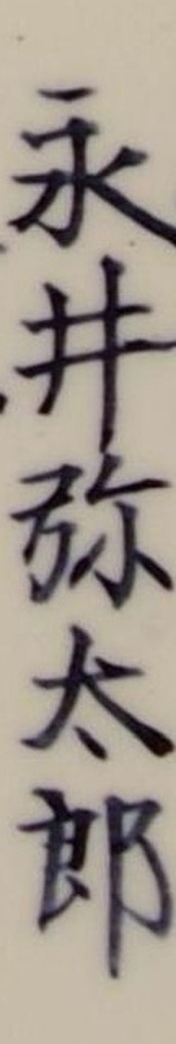永井弥太郎
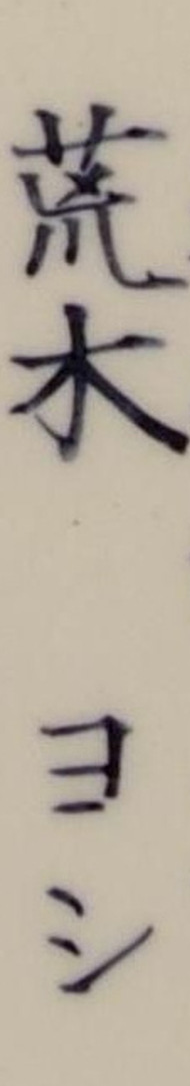荒木ヨシ
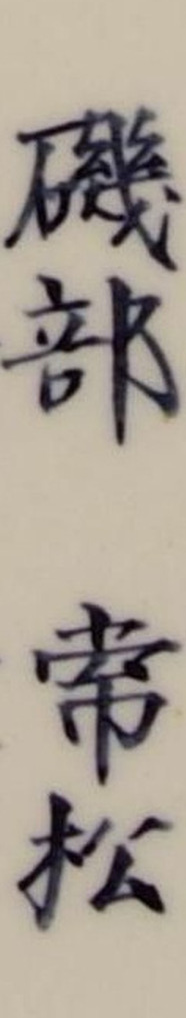磯部常松
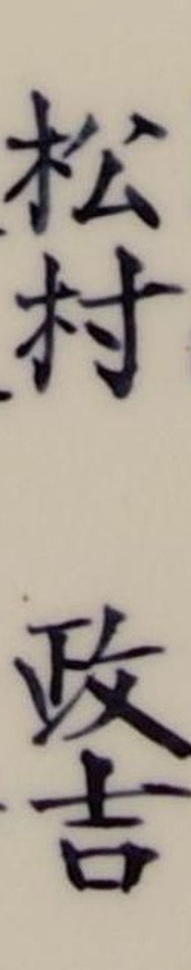松村政吉
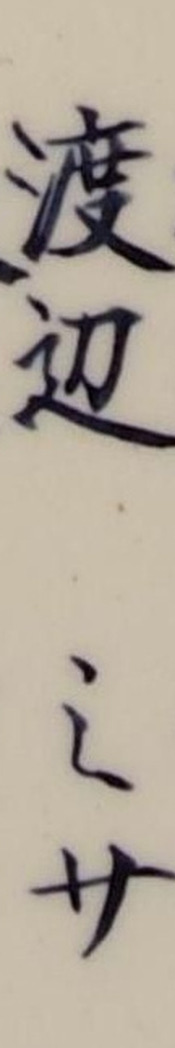渡辺ミサ
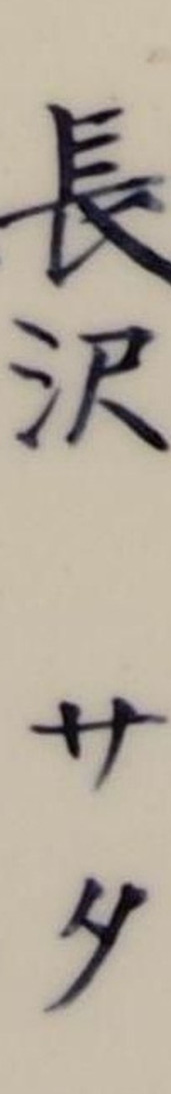長沢サタ
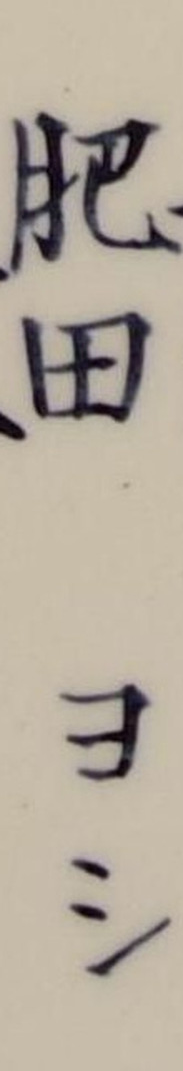肥田ヨシ
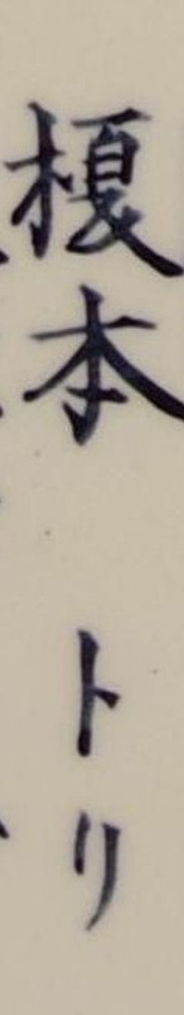榎本トリ
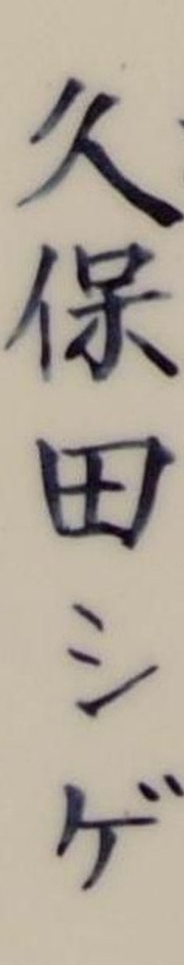久保田シゲ
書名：M~S
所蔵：高野山金剛峯寺
